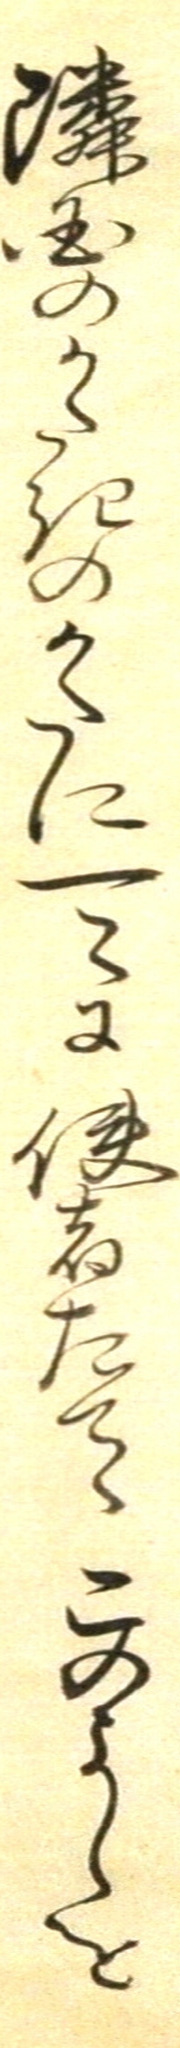隣国のかたきのかたに一々に使者たてゝこのよしを
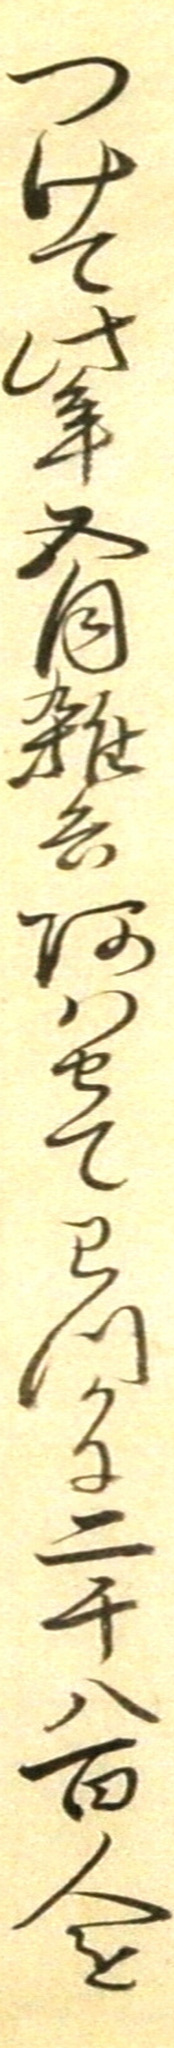つけて此年五月雑兵あはせてわつかに二千八百人を
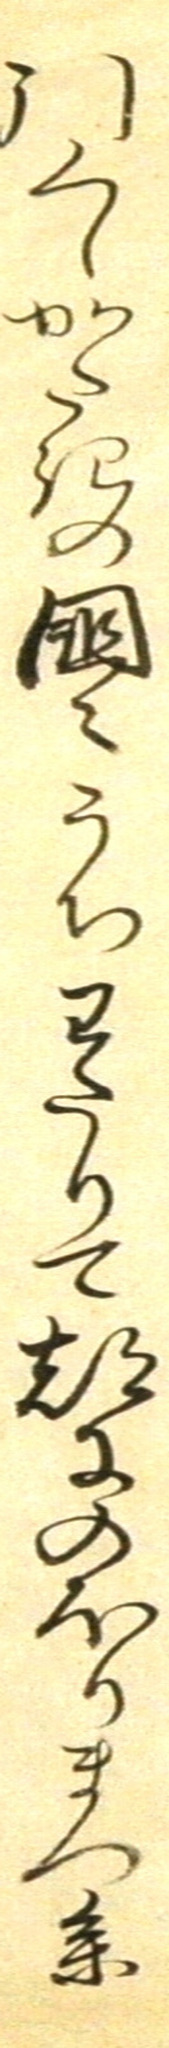引くしかたきの国々うちわたりて都にのほりまつ参
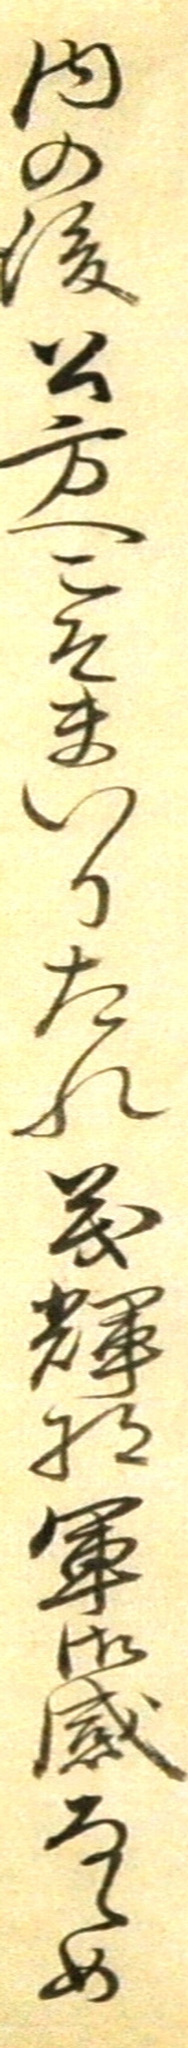内の後公方へこそまいりたれ義輝将軍御感なゝめ
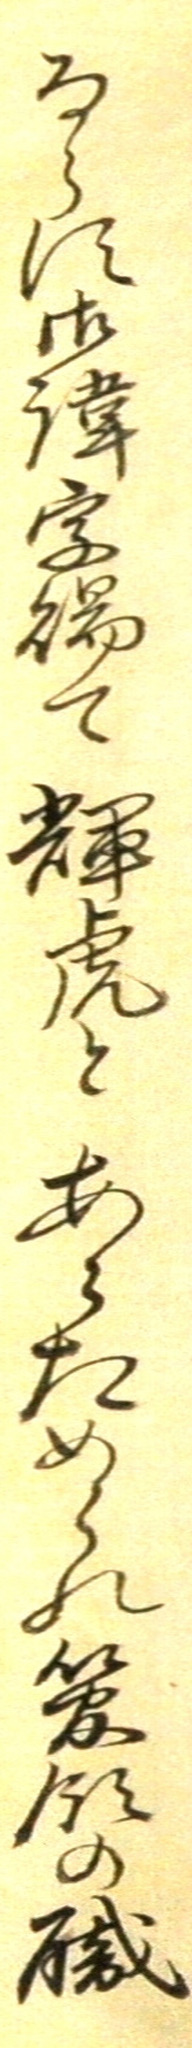ならす御諱字賜て輝虎とあらためられ管領の職

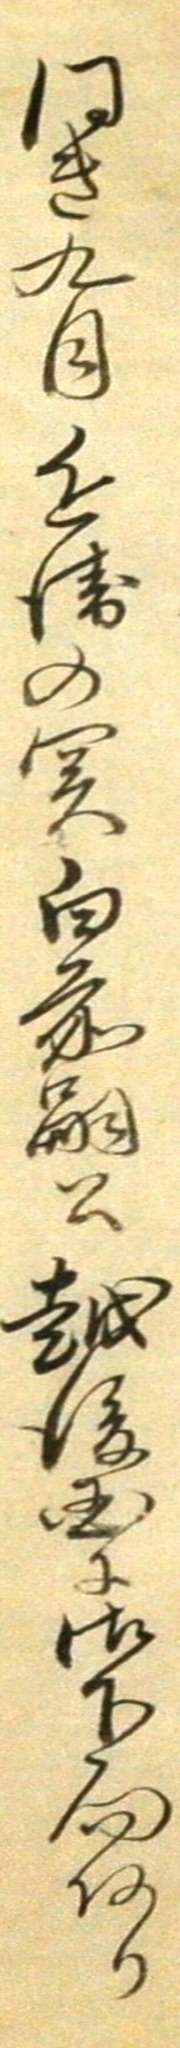同き九月近衛の関白前嗣公越後国に御下向あり
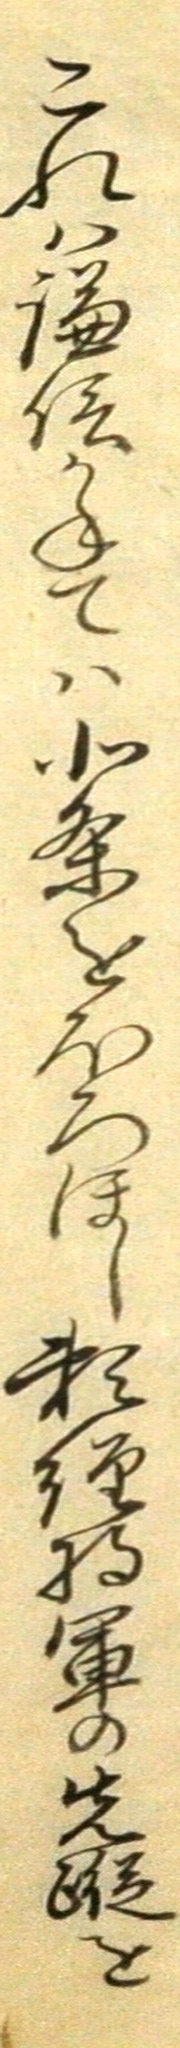これは謙信かねては北条をほろほし頼経将軍の先蹤を
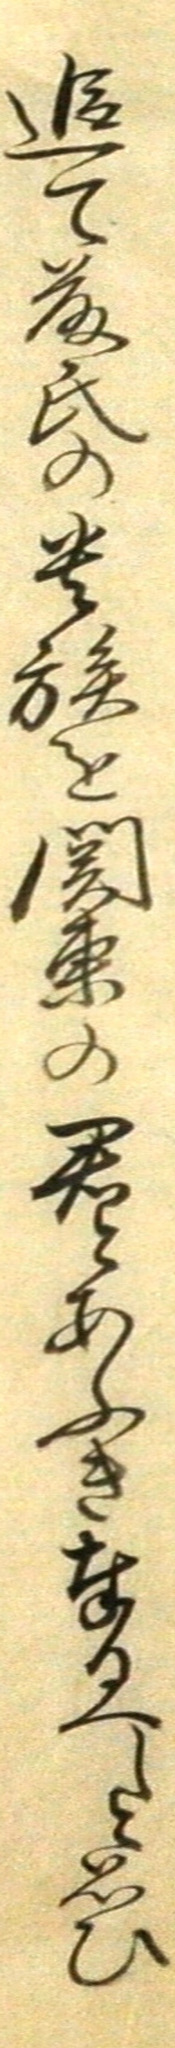追て藤氏の貴族を関東の君とあふき奉るへしと思ひ
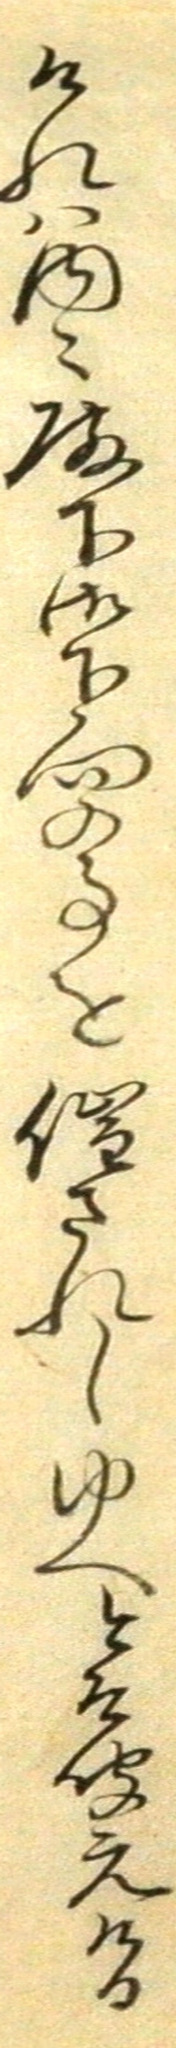けれは内々殿下御下向の事を催されしゆへとそ聞えける
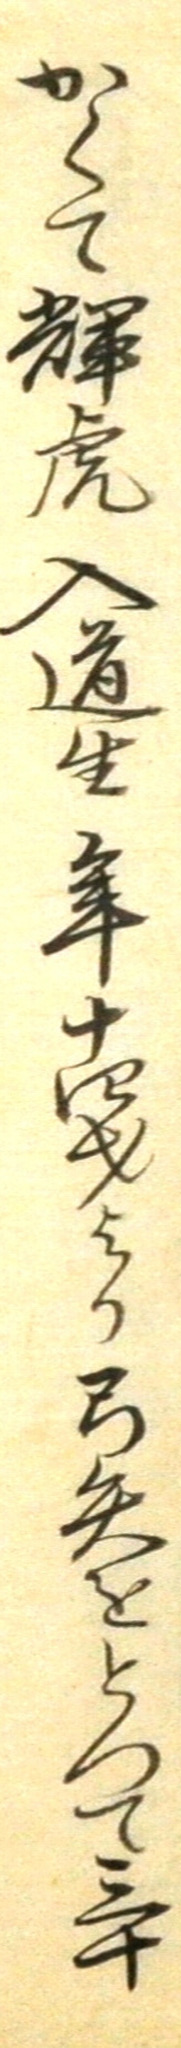かくて輝虎入道生年十四才より弓矢をとつて三十
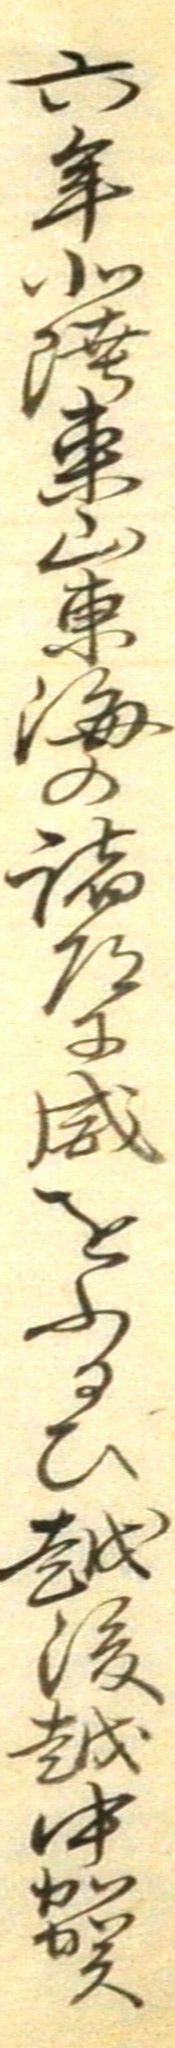六年北陸当東山東海の諸道に威をふるひ越後越中加賀
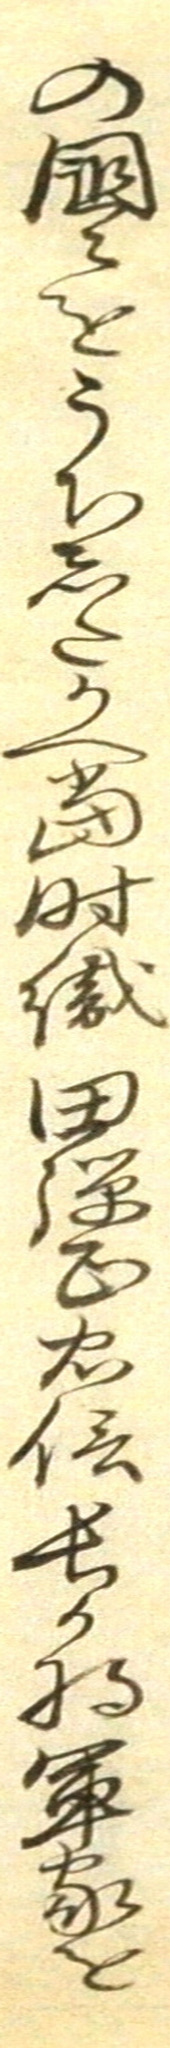の国々をうちしたかへ当寺織田弾正忠信長か将軍家を
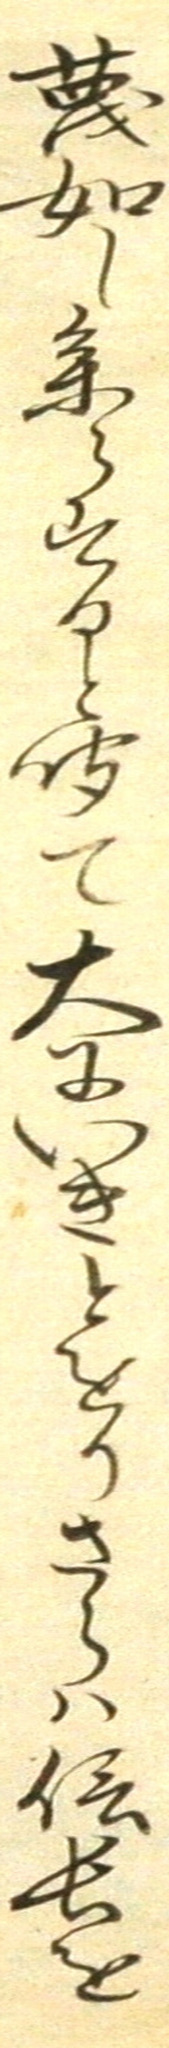蔑如し参らすると聞て大にいきとをりさらは信長を
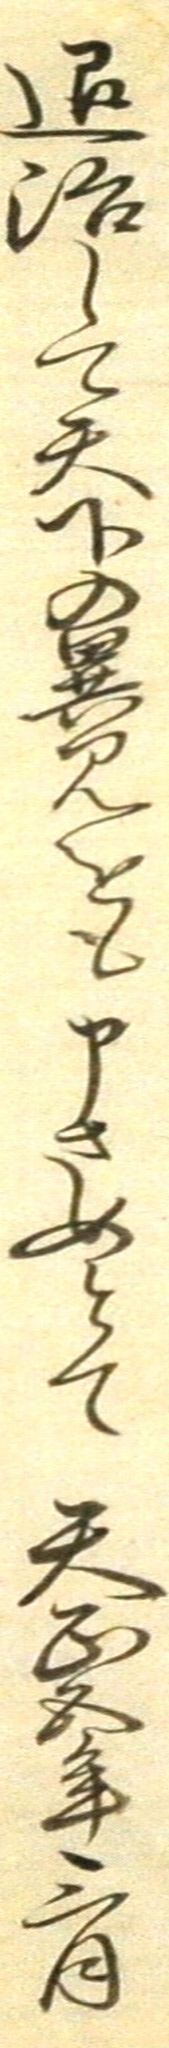退治して天下の異見をも申さめとて天正五年三月
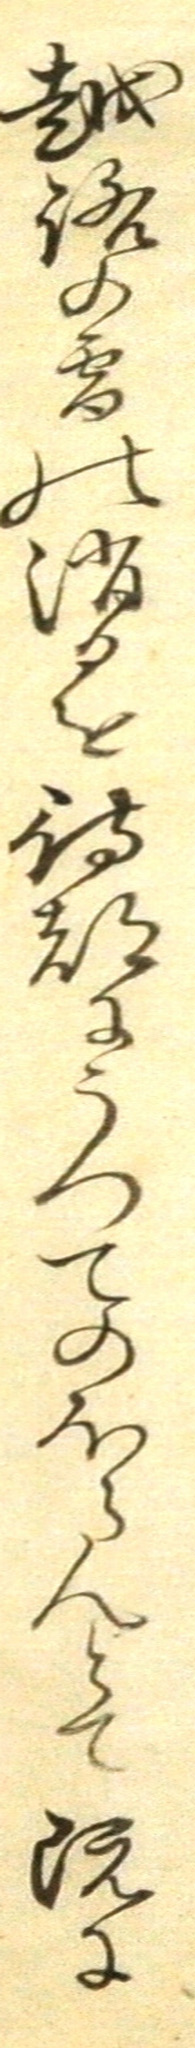越路の雪の消るを待都にうつてのほらんとて既に
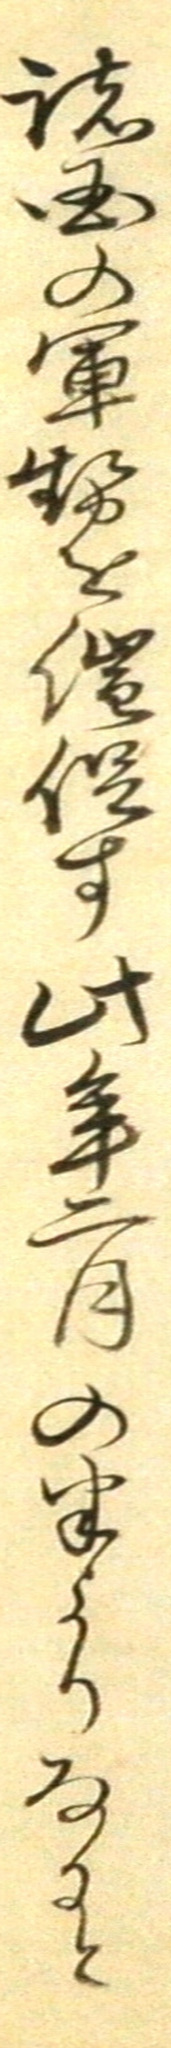諸国の軍勢を催促す此年二月の半よりなにと
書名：藩翰譜（八・下）
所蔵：伊那市立高遠町図書館・合同会社AMANE
